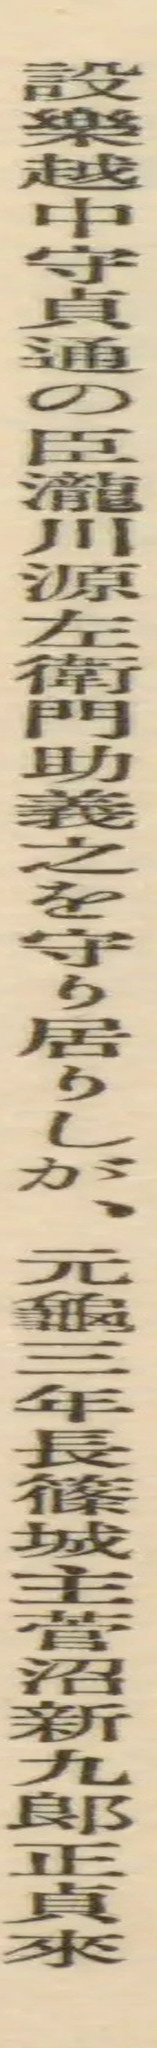設楽越中守貞通の臣瀧川源左衛門助義之を守り居りしが、元亀三年長篠城主菅沼新九郎正貞来
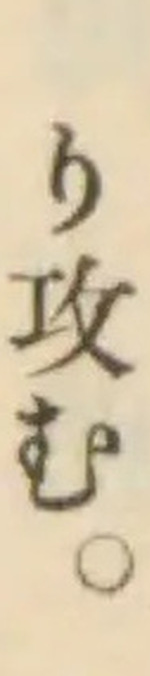り攻む。
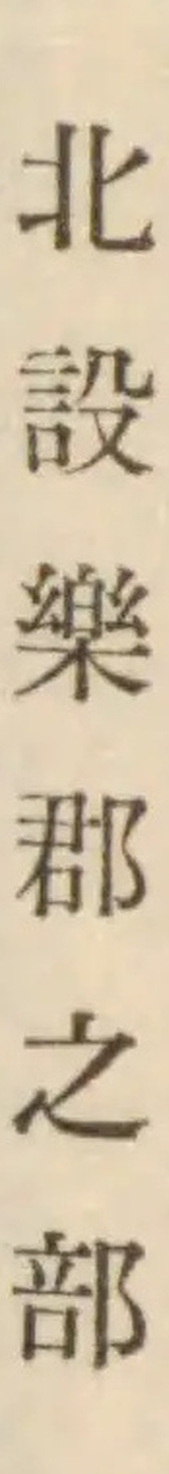北設楽郡之部
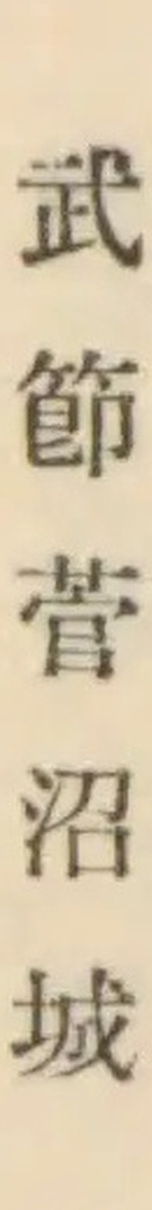武節菅沼城
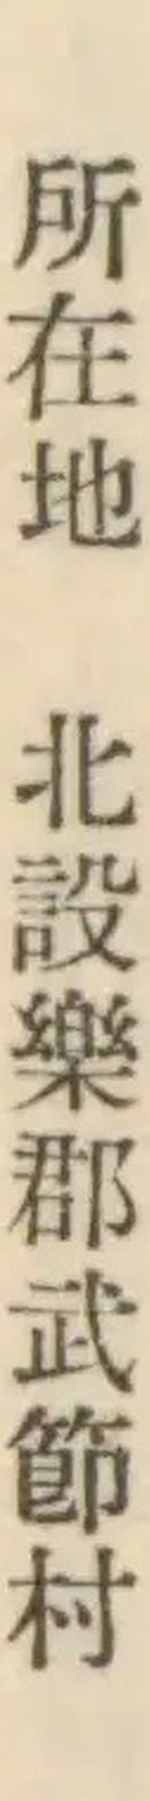所在地北設楽郡武節村
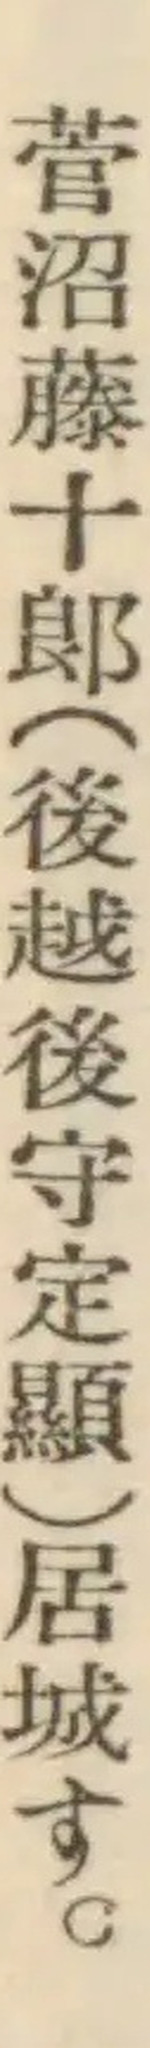菅沼藤十郎(後越後守定顕)居城す。
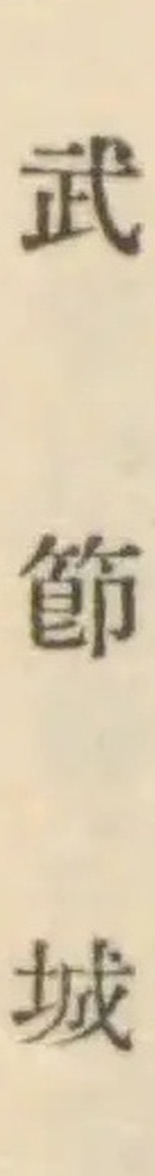武節城
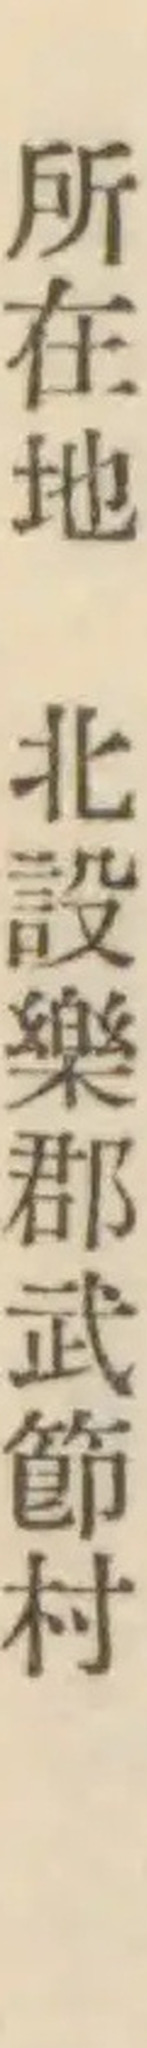所在地北設楽郡武節村
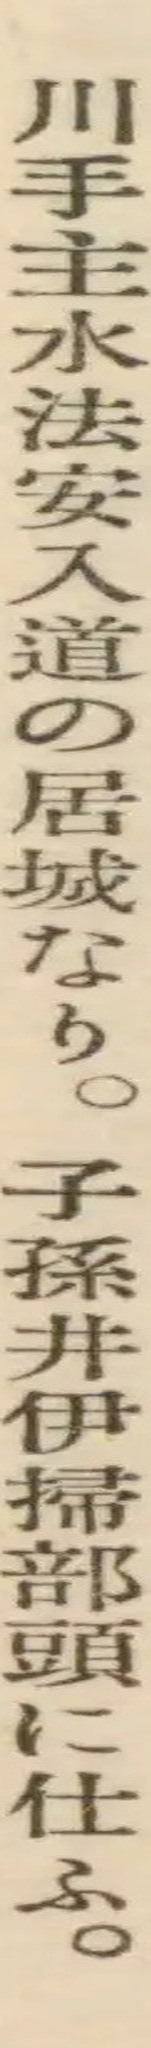川手主水法安入道の居城なり。子孫井伊掃部頭に仕ふ。
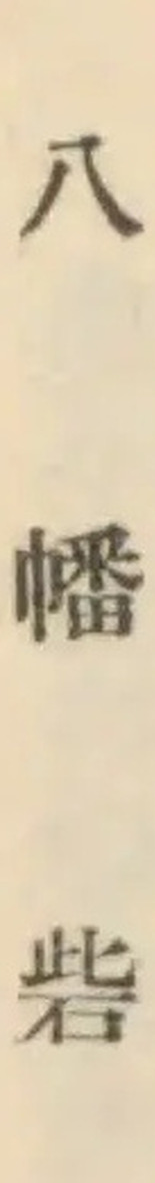八幡砦
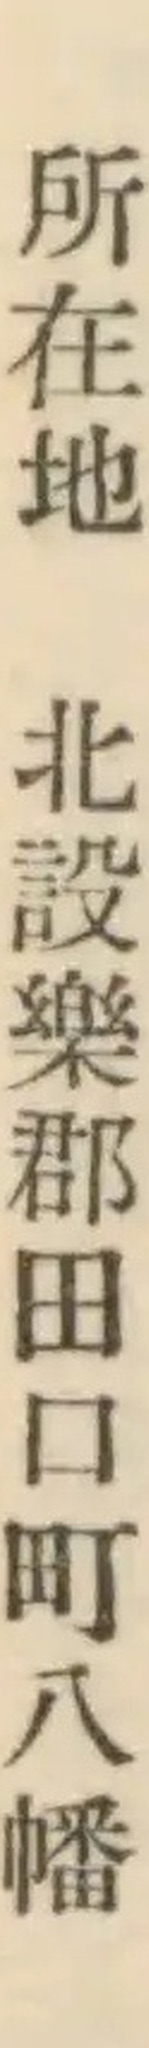所在地北設楽郡田口町八幡
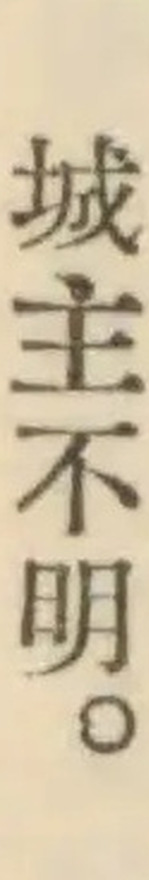城主不明。
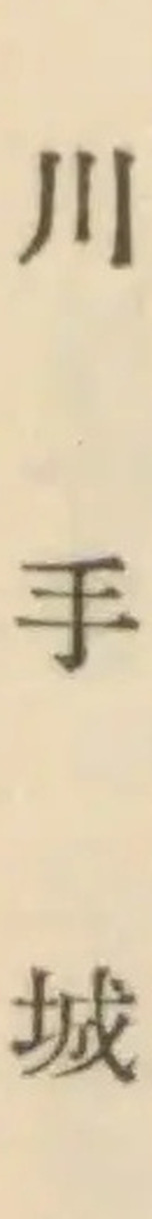川手城
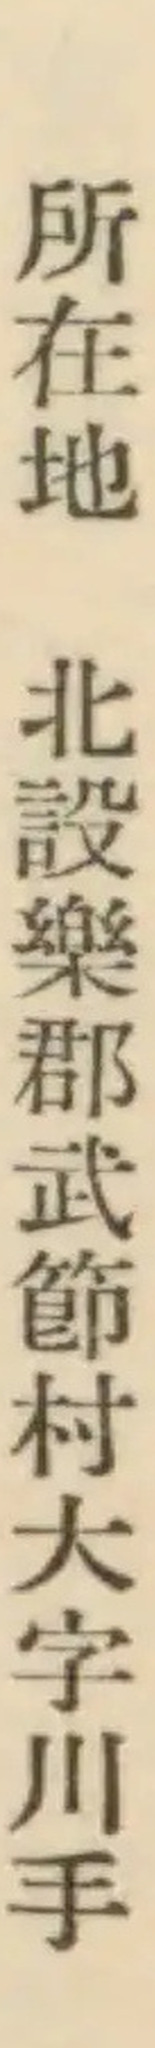所在地北設楽郡武節村大字川手
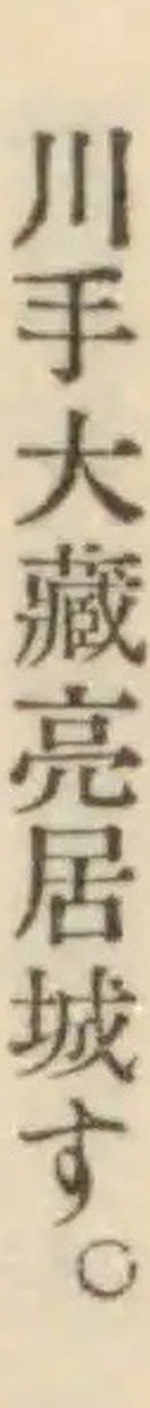川手大蔵亮居城す。
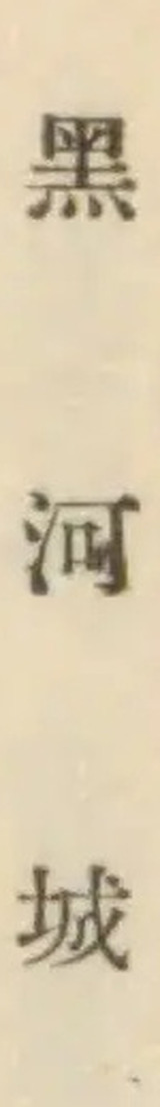黒河城
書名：東三河之古城
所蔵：国立国会図書館 National Diet Library, JAPAN
